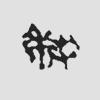殺
